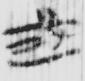或（又）
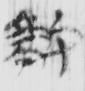殺
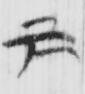下
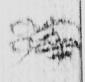○（蔡）
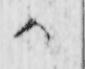人
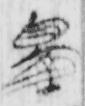睪
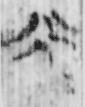小人
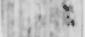人
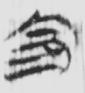命
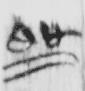爲
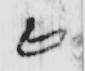㠯（以）
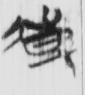傳
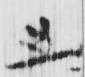之
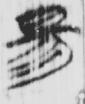昜（陽）
